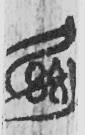{尸㡭}
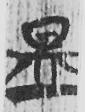昷
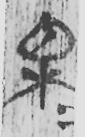冥=
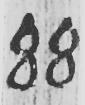兹
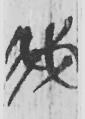我
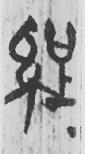{糸呈}
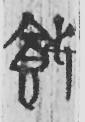{食旡}
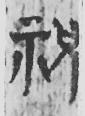祝
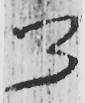乃
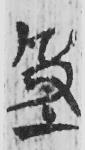{殳土}
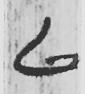㠯（以）
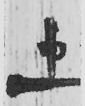土
